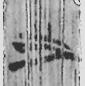之
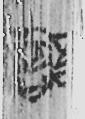語
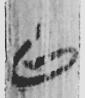㠯（以）
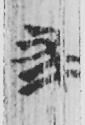求
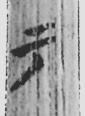亓
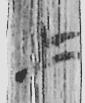上
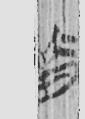昔
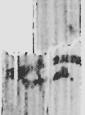才
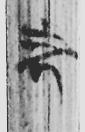先
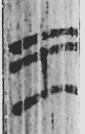王
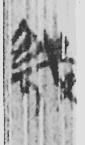幾
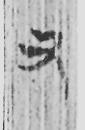又
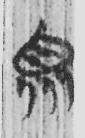眾
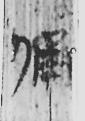俑
